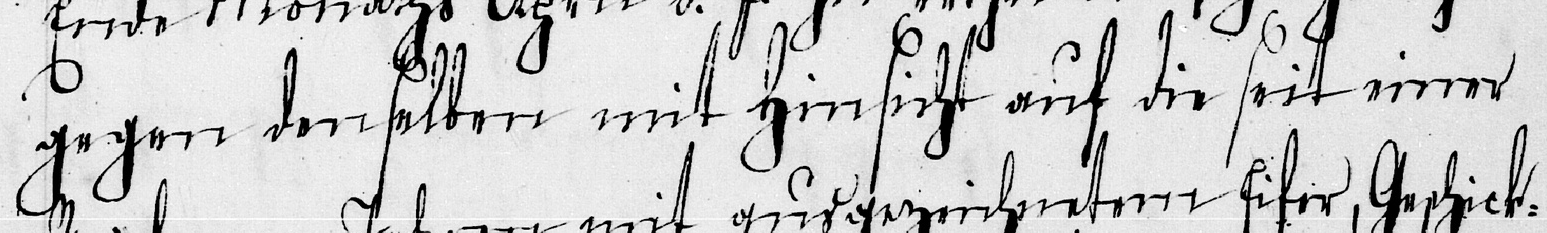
gegen denselben mit Hinsicht auf die seit einer
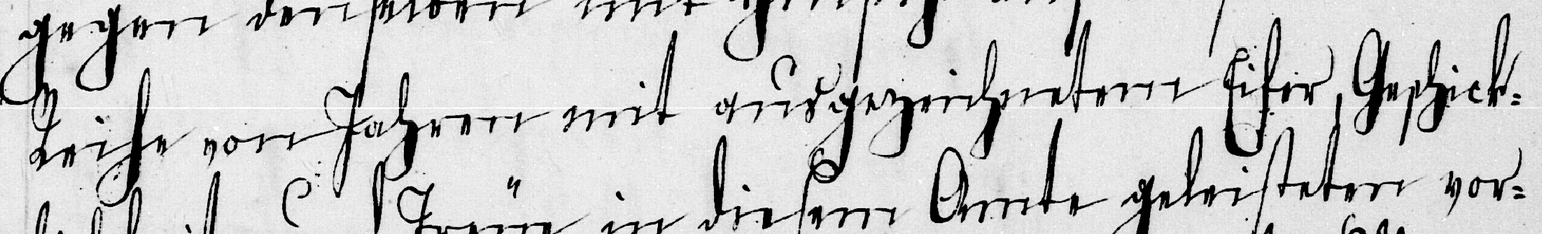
Reihe von Jahren mit ausgezeichnetem Eifer, Geschick¬
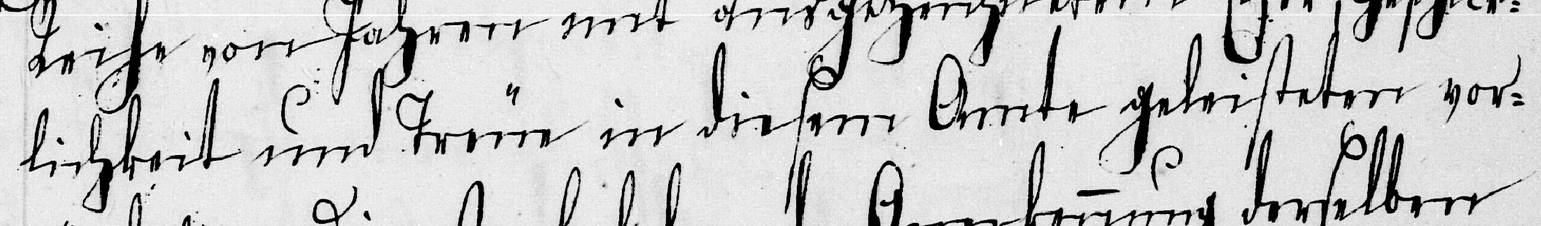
lichkeit und Treue in diesem Amte geleisteten vor¬
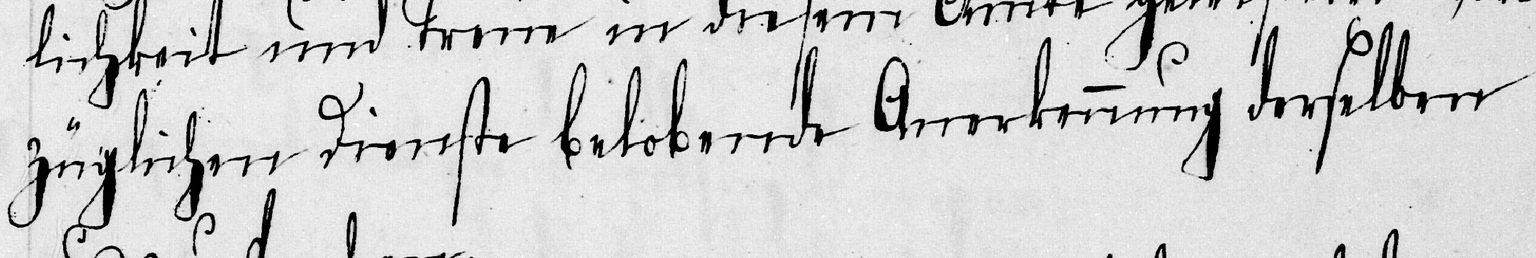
züglichen Dienste belobende Anerkennung derselben
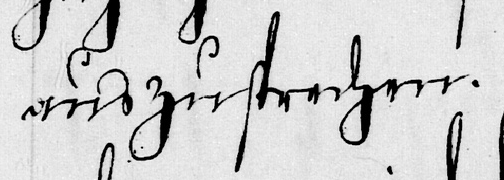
auszusprechen.
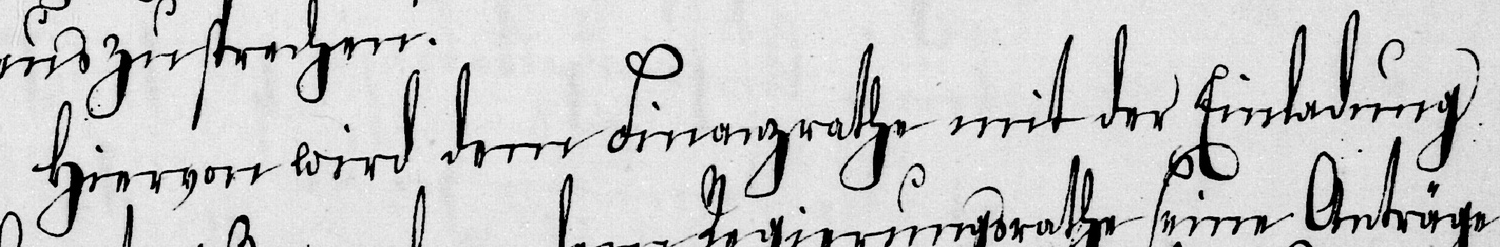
Hiervon wird dem Finanzrathe mit der Einladung
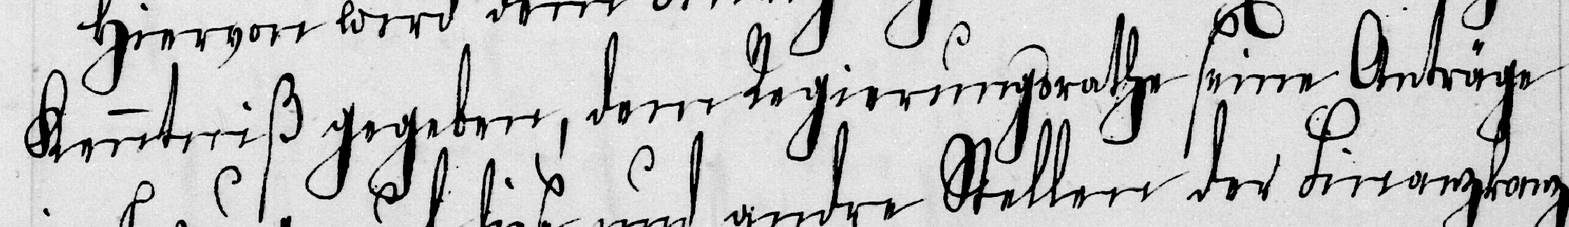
Kenntniß gegeben, dem Regierungsrathe seine Anträge
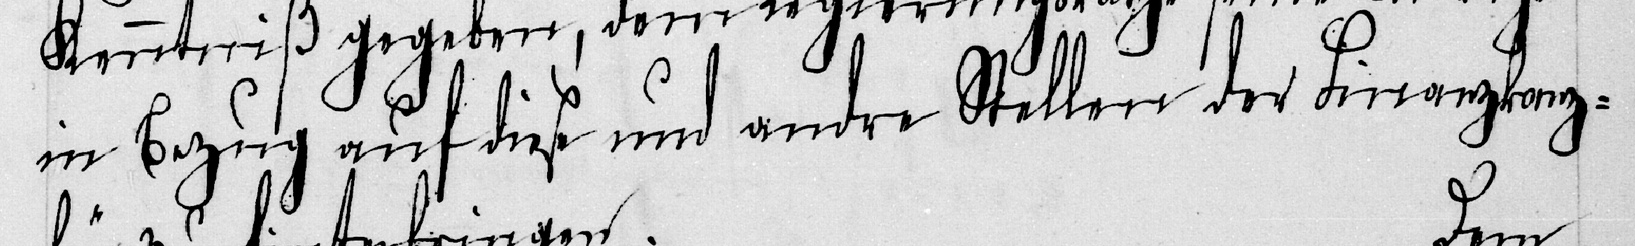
in Bezug auf diese und andre Stellen der Finanzkanz¬
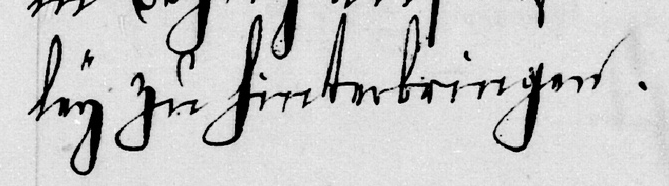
ley zu hinterbringen.
